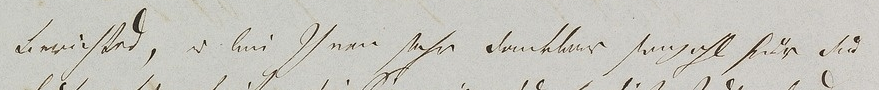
Berichtes, u bin Ihnen sehr dankbar sowohl für die
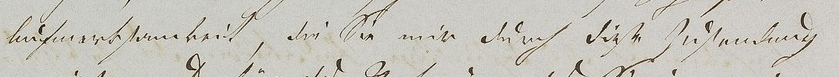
Aufmerksamkeit, die Sie mir durch diese Zusendung
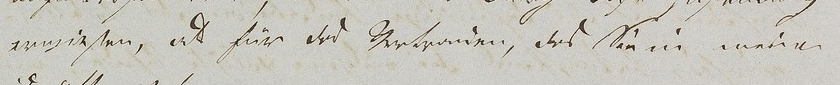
erwiesen, als für das Vertrauen, das Sie in meine
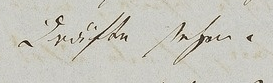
Kräfte setzen.
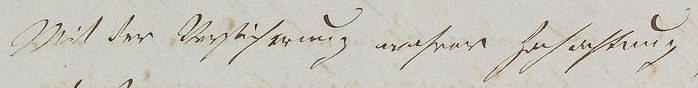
Mit der Versicherung wahrer Hochachtung,
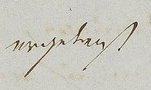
ergebenst
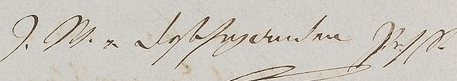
J. W. v. Deschwanden Prfss.
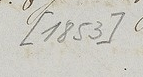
Nachmitt.
